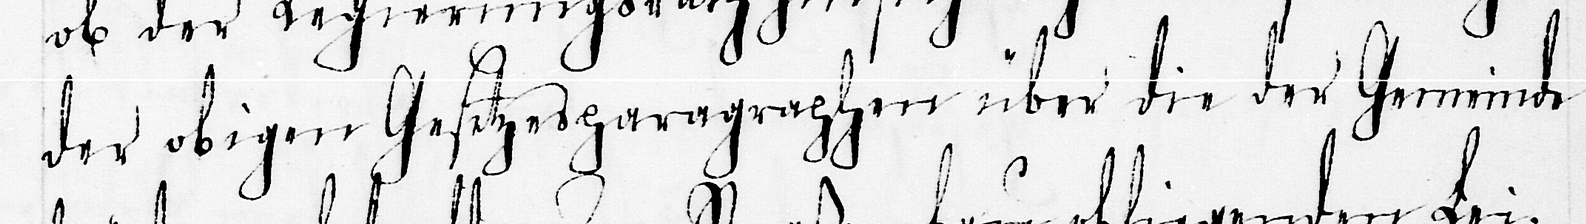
der obigen Gesetzesparagraphen über die der Gemeinde
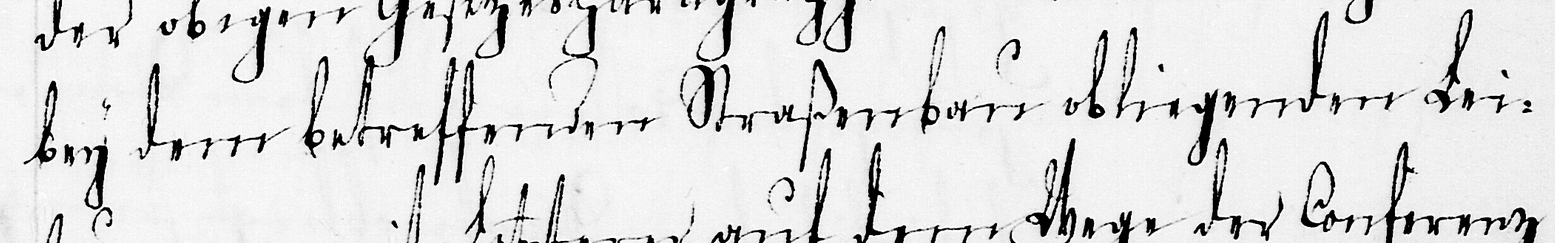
bey dem betreffenden Straßenbau obliegenden Lei¬
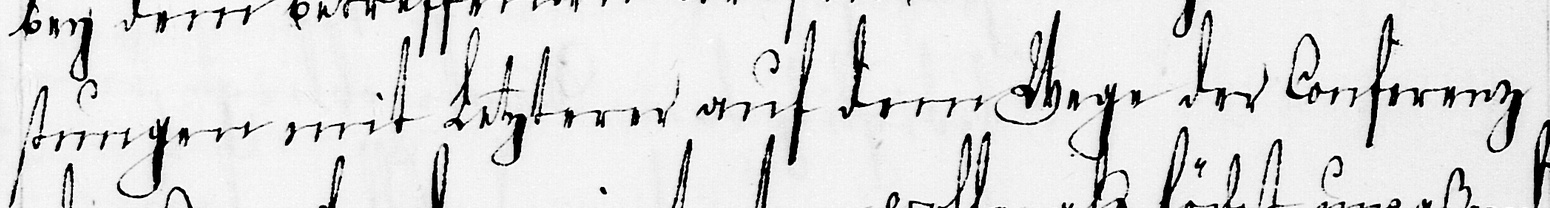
stungen mit Letzterer auf dem Wege der Conferenz
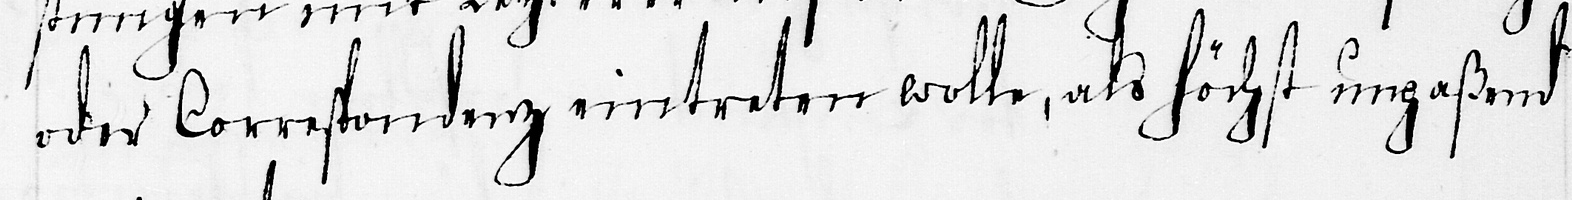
oder Correspondenz eintreten wolle, als höchst unpaßend
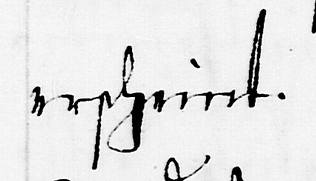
erscheint.
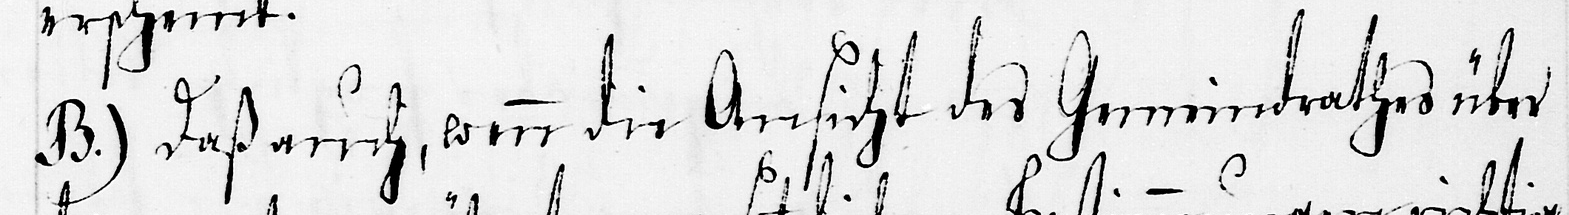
B.) Daß auch, wenn die Ansicht des Gemeindrathes über
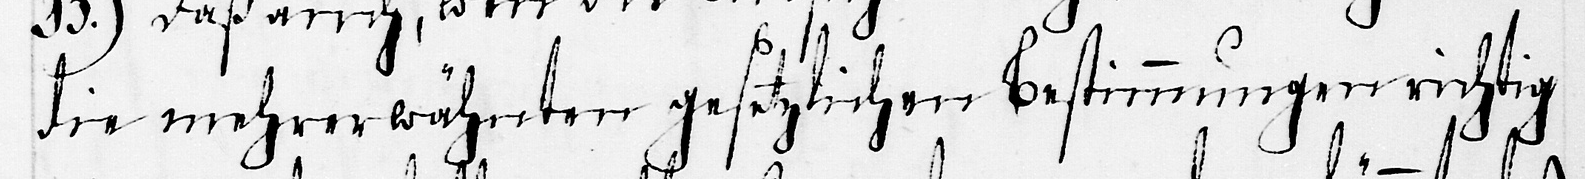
die mehrerwähnten gesetzlichen Bestimmungen richtig
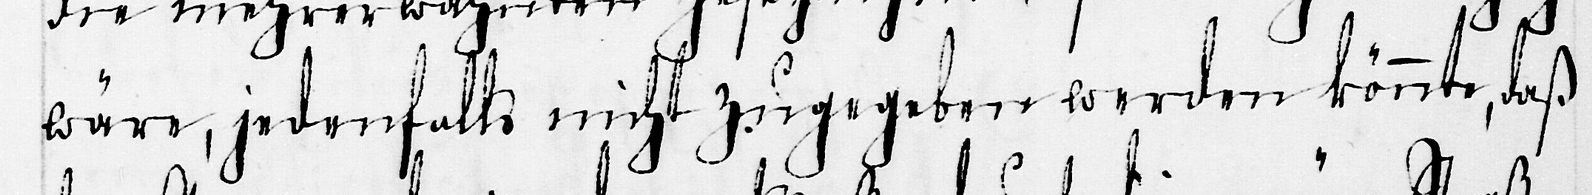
wäre, jedenfalls nicht zugegeben werden könnte, daß
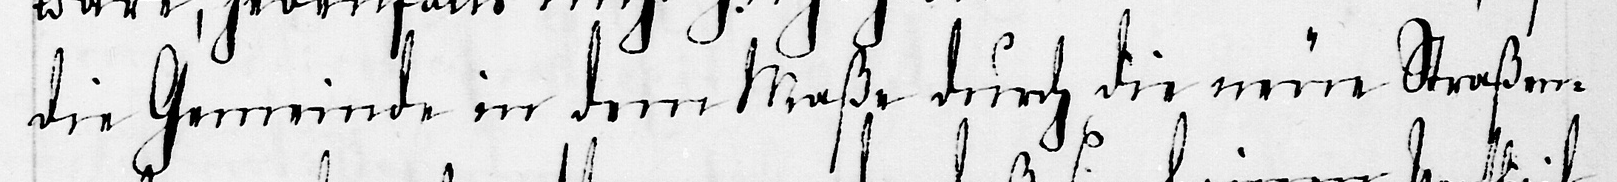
die Gemeinde in dem Maße durch die neue Straßen¬
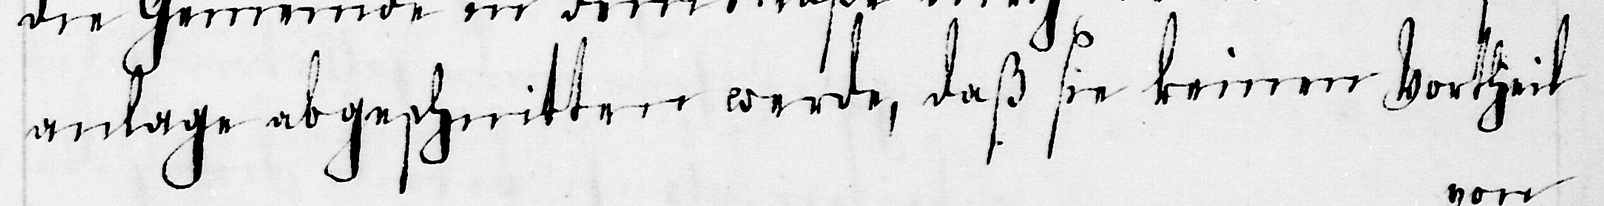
anlage abgeschnitten werde, daß sie keinen Vortheil
